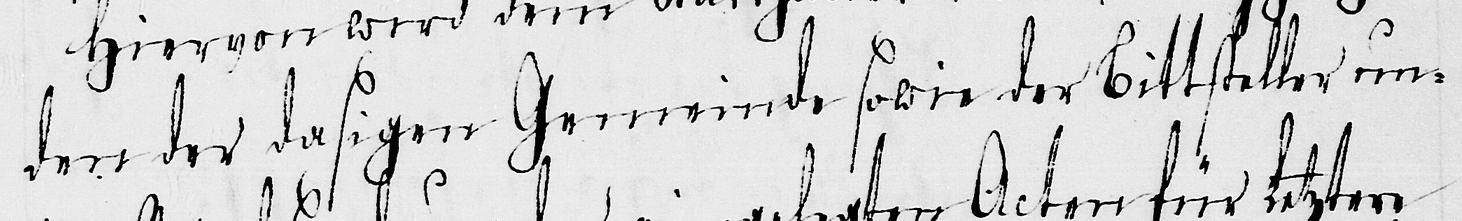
den der dasigen Gemeinde sowie der Bittsteller un¬
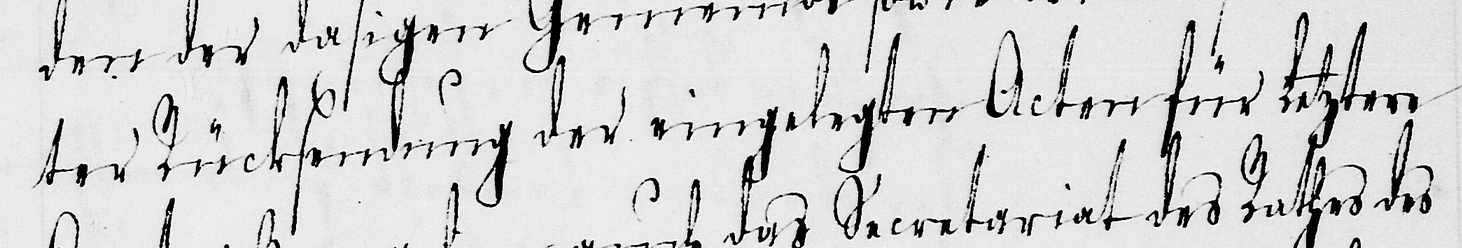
ter Rücksendung der eingelegten Acten für Letztere
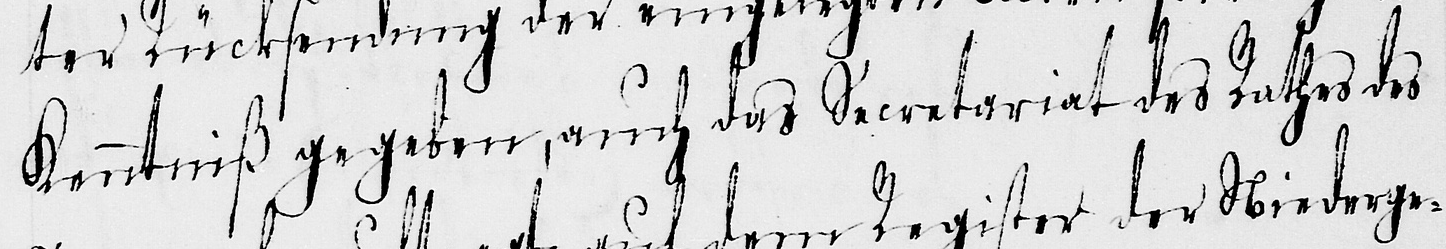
Kenntniß gegeben, auch das Secretariat des Rathes des
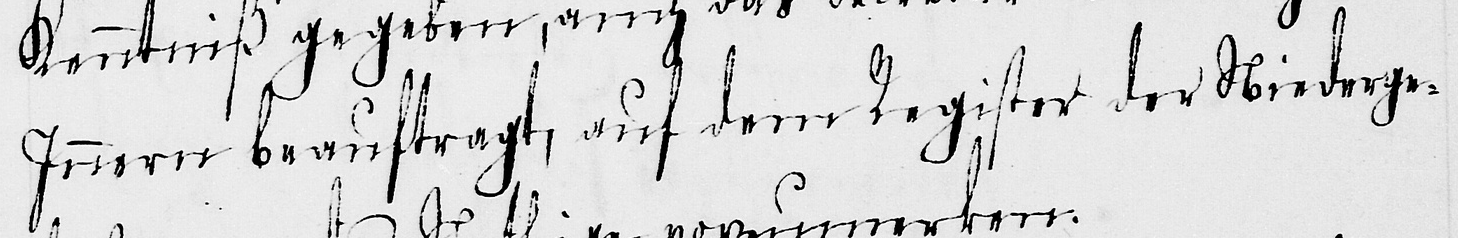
Innern beauftragt, auf dem Register der Niederge¬
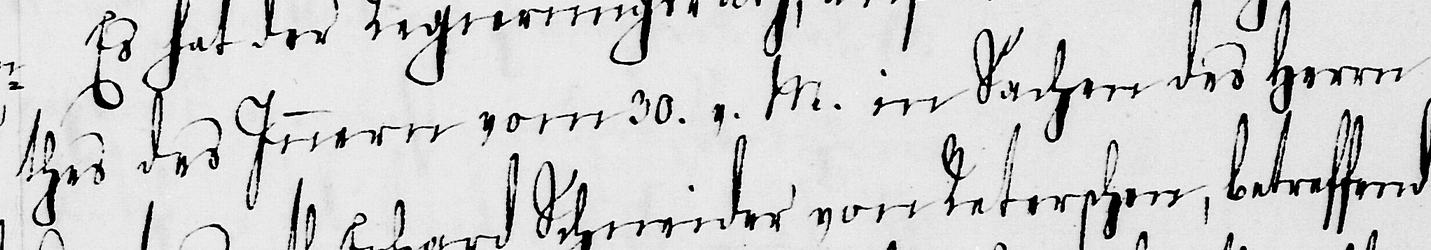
thes des Innern vom 30. v. M. in Sachen des Herrn
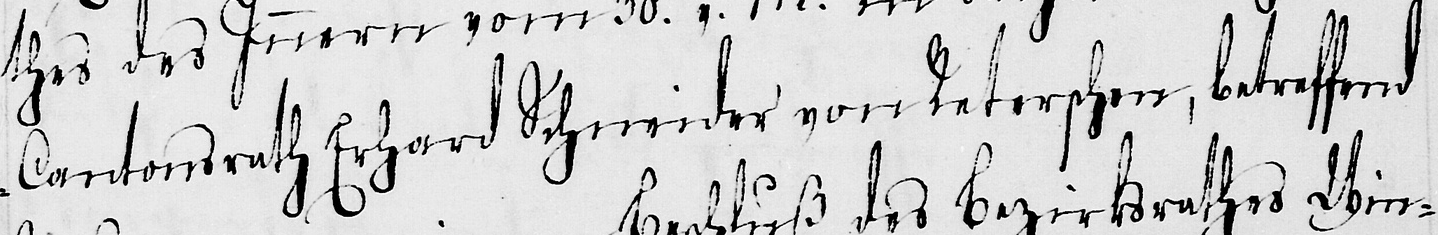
Cantonsrath Erhard Schneider von Reterschen, betreffend
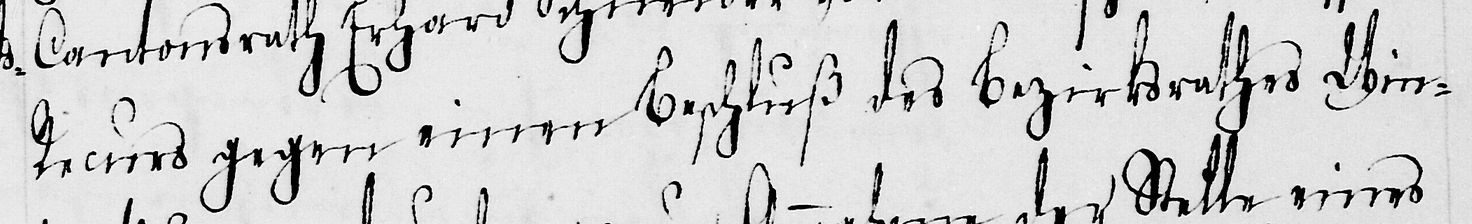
Recurs gegen einen Beschluß des Bezirksrathes Win¬
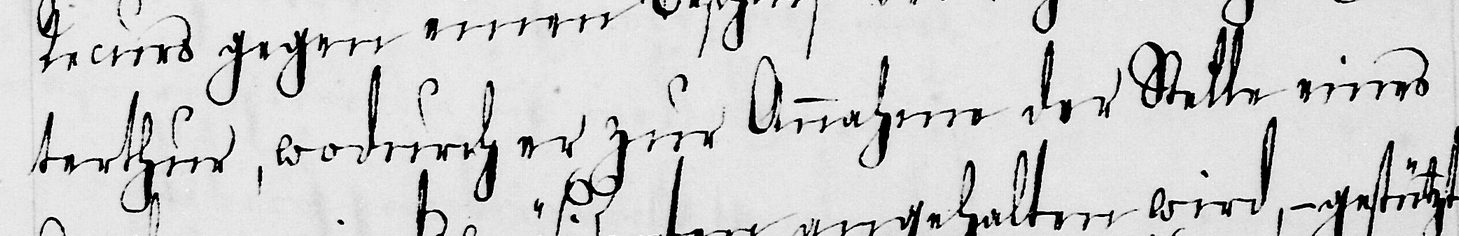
terthur, wodurch er zur Annahme der Stelle eines
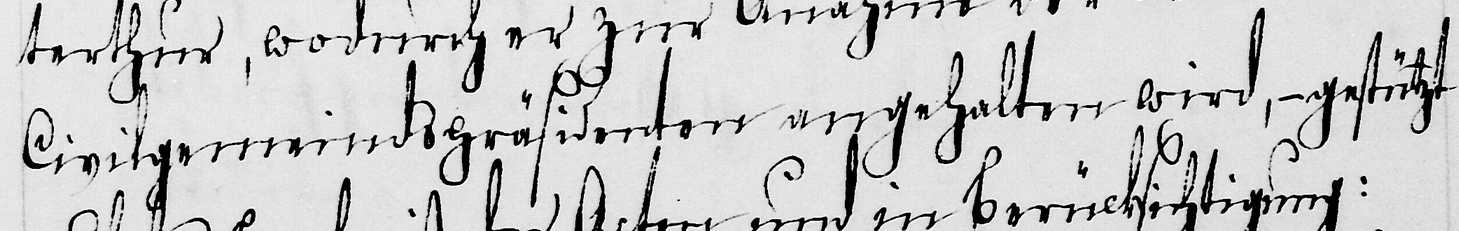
Civilgemeindspräsidenten angehalten wird, gestützt
